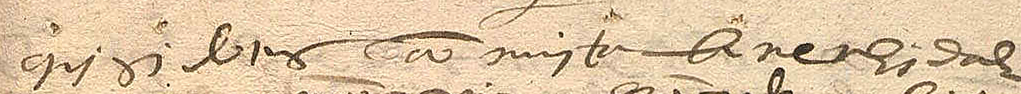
qujsidores c̄o mujta benenhidade
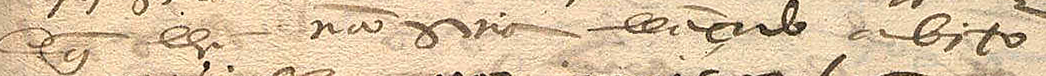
e q̄ lhe não seria llāçado abito
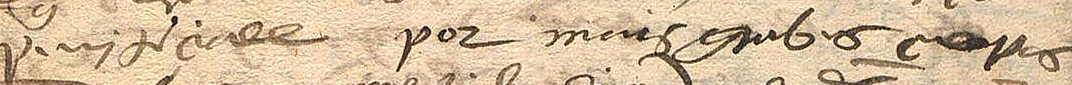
penjtēciall por mais graves cullpas
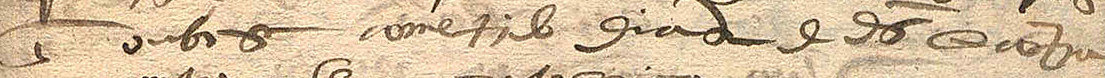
q̄ ouvese cometido diāte de ds̄ e cōtra
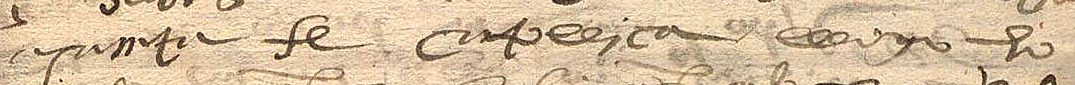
a samta fe catolljca / e llogo ho
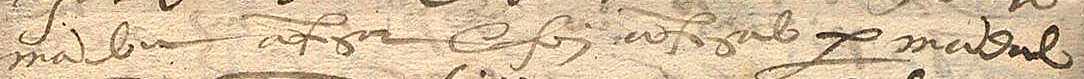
mādou cōfesar e foj c̄ofesado ꝑ mādado
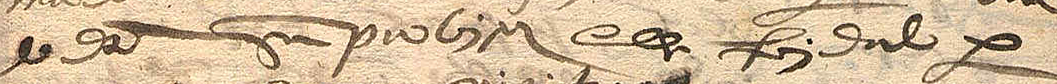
do dt̄o s̄or provjsor e lhe foj dado ꝑ
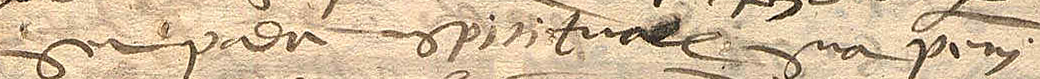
seu padre espirituall sua penj
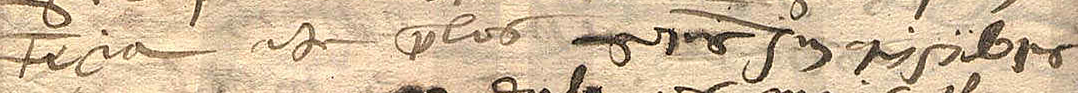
tēcia ate p̄los sor̄es Jmqujsidores
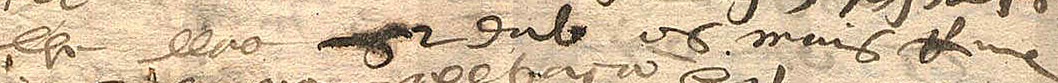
lhe llaa ser dado os mais Reme
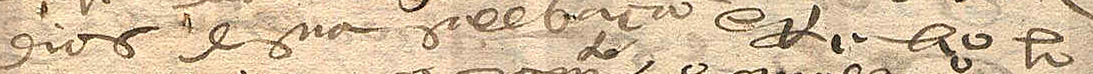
dios de sua sallvação e Recebeo ho
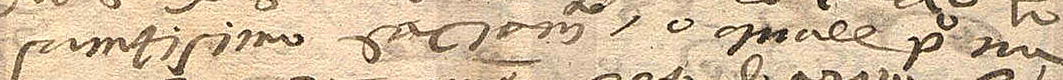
samtisimo sacramto / o quall po nu
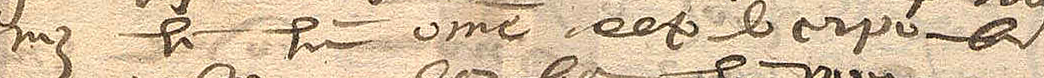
nez he hū omē allto do corpo bē
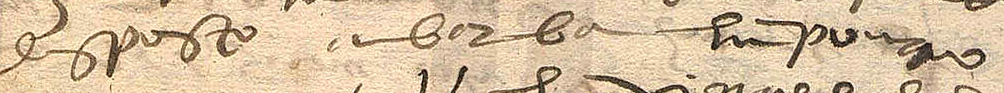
desposto a barba hū pouquo
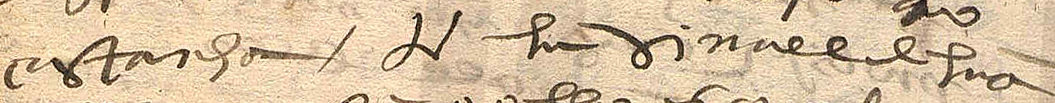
castanha / tē hū sinall de huā
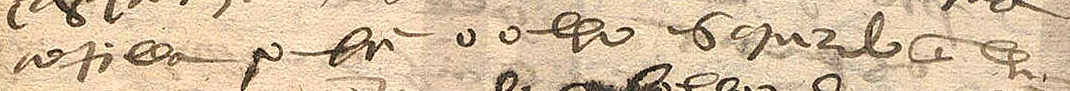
cotilla sobre o olho esquerdo q̄ lhe
